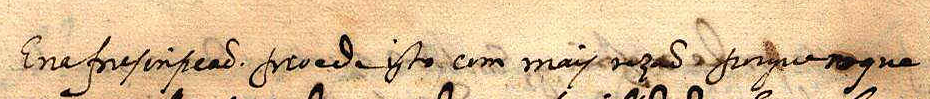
E na presinpçaõ pode isto com mais rezaõ porque no que
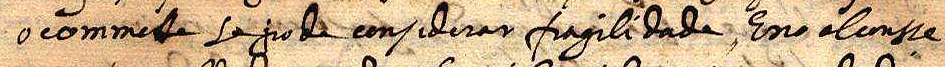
o commette se pode considerar fragilidade, E no alcansse
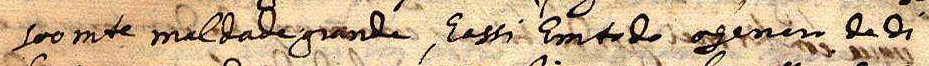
soomte maldade grande, E assi Em todo o genero de di
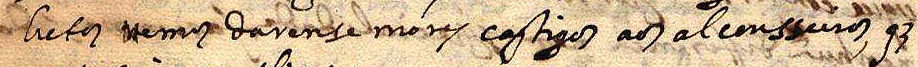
lictos nemos darense mores castigos aos alcousseiros, qꝫ.
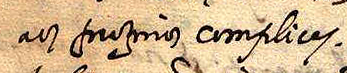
aos proprios complices.
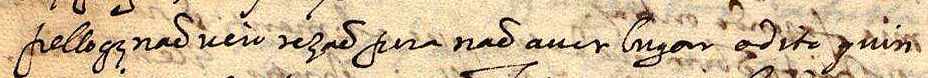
pello qꝫ naõ ueio rezaõ pera naõ auer lugar o dito quin
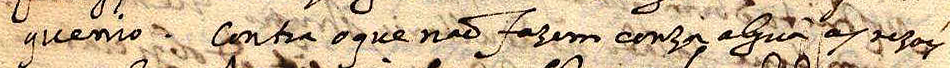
quenio contra o que naõ fazem couza alguā as rezoẽs
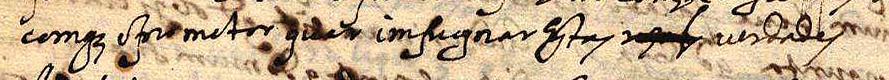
com qꝫ o promotor quer impugnar Estas _ uerdades
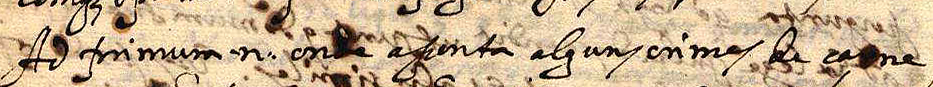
Ad primum n. onde assenta alguns crimes de carne
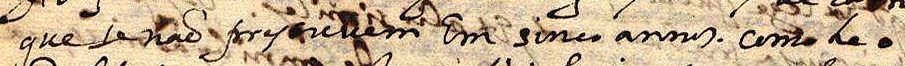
que se naõ prescreuem Em sinco annos. como he o
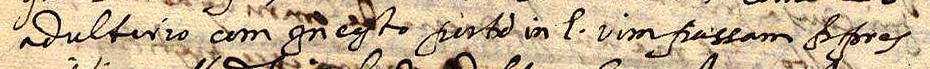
adulterio com jncesto partē in l. vim passam p̄pres
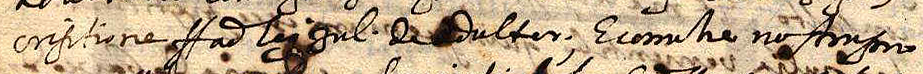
crisitione ff ad leg Jul de _dulter, E como he nostru pro
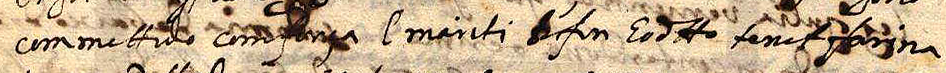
commettido com força l mariti _ fon E o ditto tenet farina
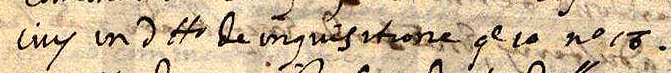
eius in ditto de inquisitione qe 10 no 18.
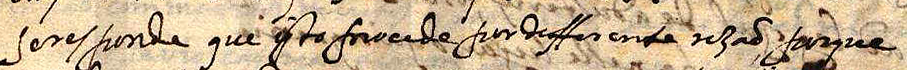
Se responde que isto procede por differente rezaõ porque
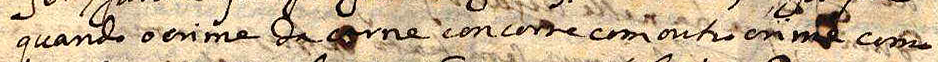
quando o crime da carne concorre com outro crime como
